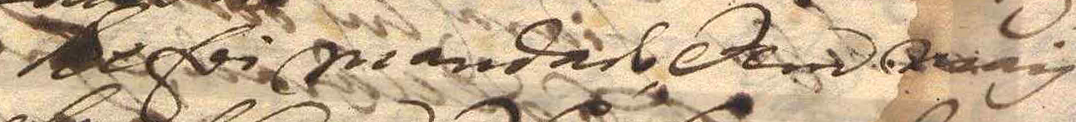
lhe foi mandado, e tem mais
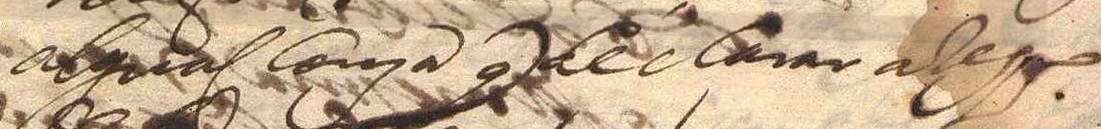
alguaꝭ Couza q̄ declarar a Resp.o
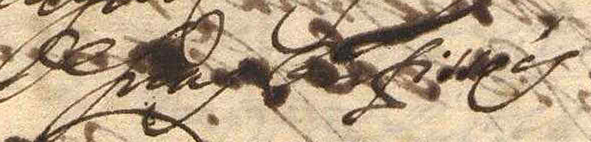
de suas Confissoẽs.
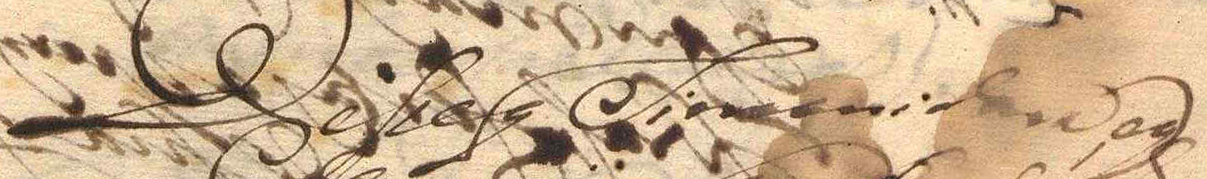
Disse q̄ sim cuidara, e q̄
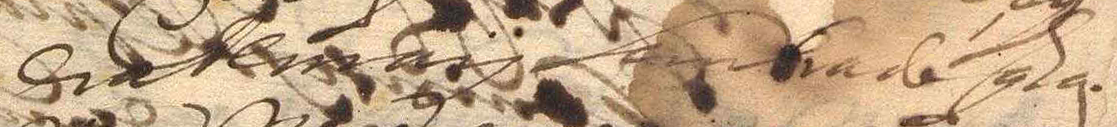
era de mais Lembrado q̄ ha
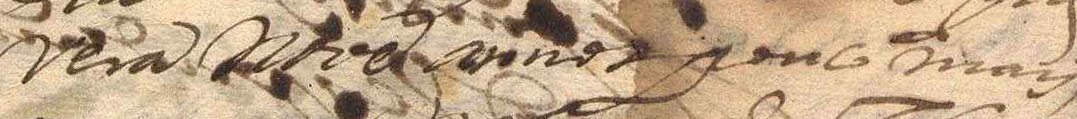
vera nove annos pouco mais
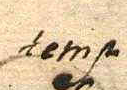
temp
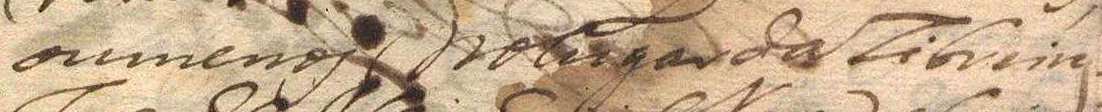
ou menos no lugar da Zibreira
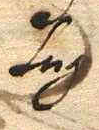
lug
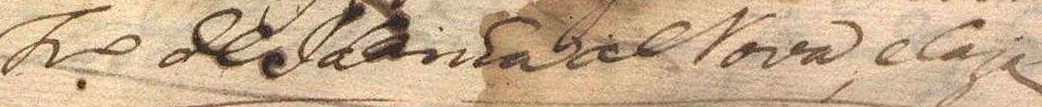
tr.o de Idanha a Nova, e Caza
